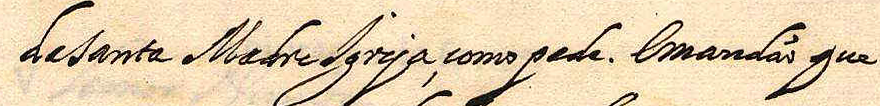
da santa Madre Igreja como pode. E mandaõ que
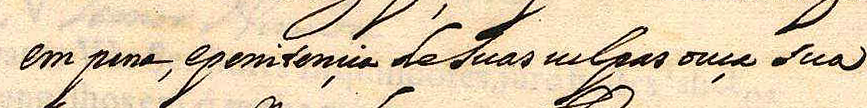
em pena, e penitencia de Suas culpas ouça sua
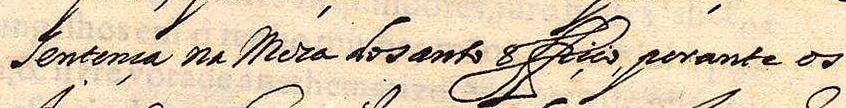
Sentença na Meza do santo officio, perante os
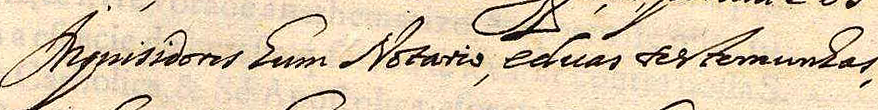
Jnquisidores hum Notario, e duas testemunhas,
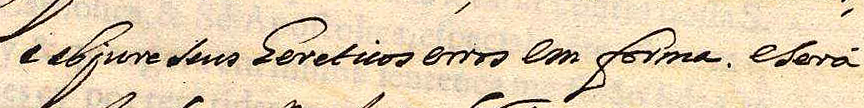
e abjure seus hereticos erros em forma. e será
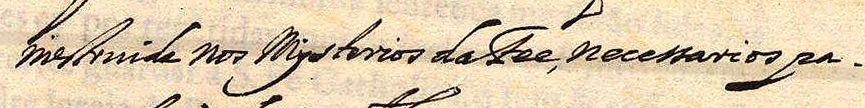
instruida nos Mysterios da Fee, necessarios pa
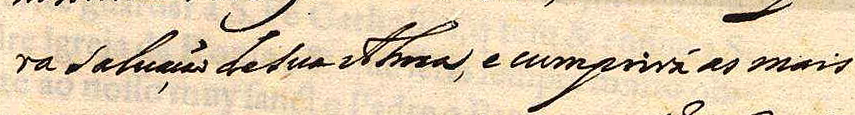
ra saluação de sua Alma, e cumprirá as mais
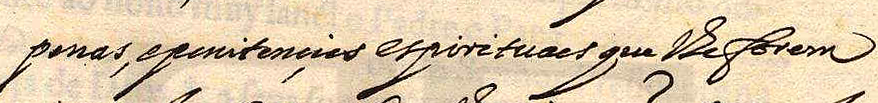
penas, e penitencias espirituaes que lhe forem
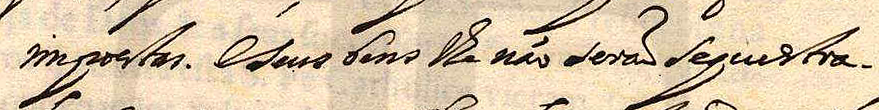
impostas. E seus bens lhe não seraõ sequestra
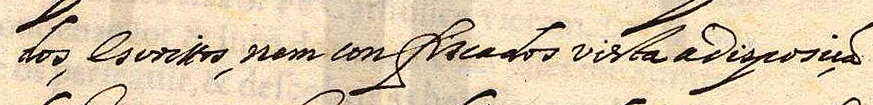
dos, escrittos, nem confiscados vista a disposiçaõ
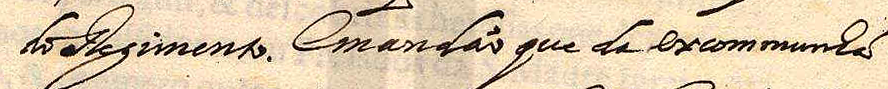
do Regimento. E mandaõ que da excommunhaõ
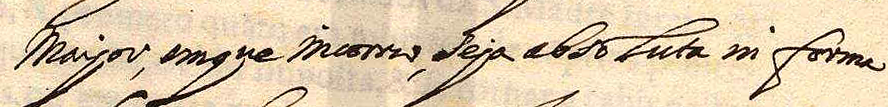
Mayor, em que incorreo, seja absoluta in forma
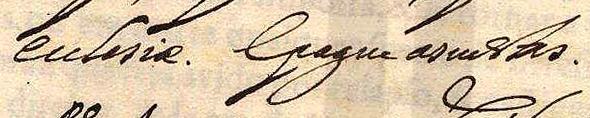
ecclesiæ. E pague as custas.
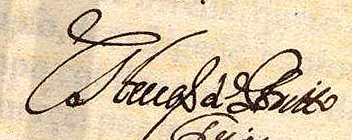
Esteuaõ de Britto
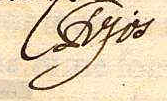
Foyos
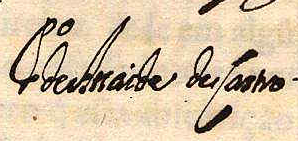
Po de Attaide de Castro.
